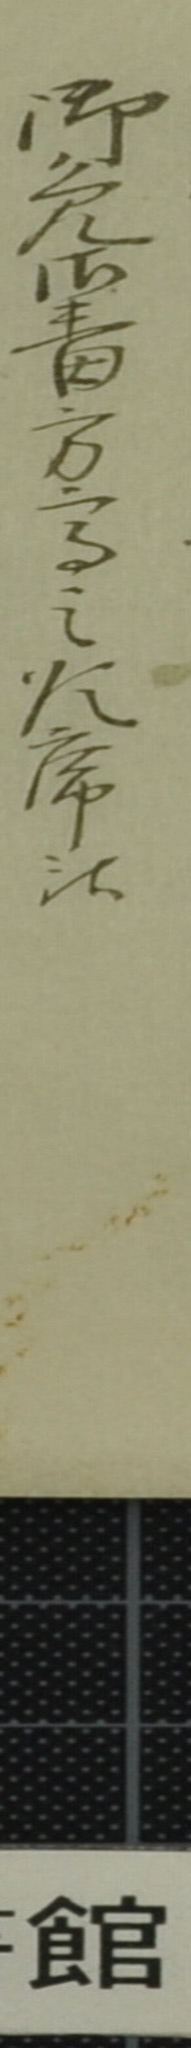御免御番方高之順席被
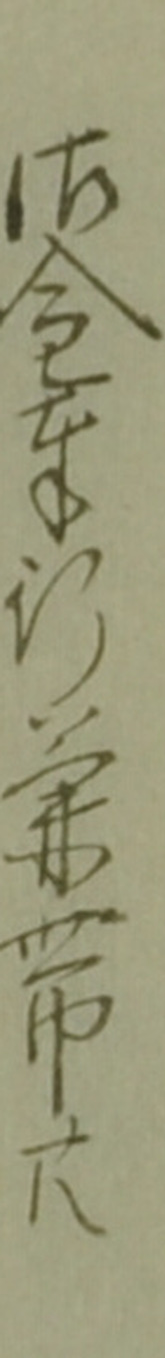御金奉行兼帯共
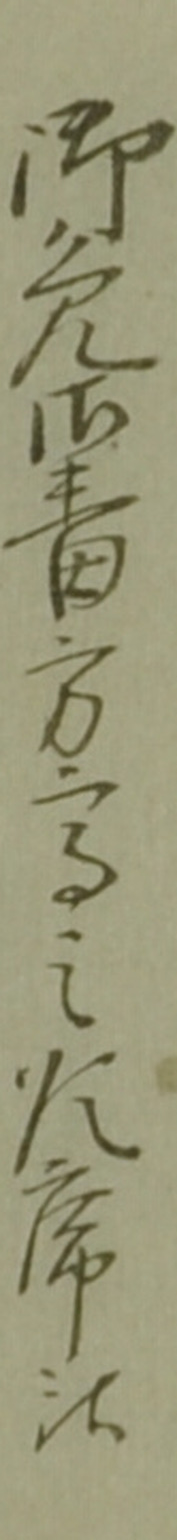御免御番方高之順席被
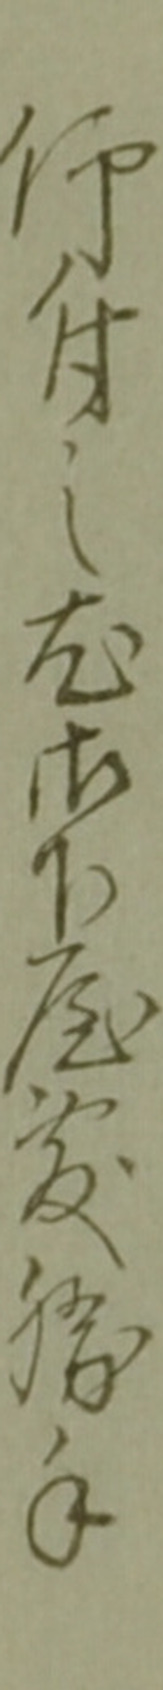仰付之尤御下屋敷勝手
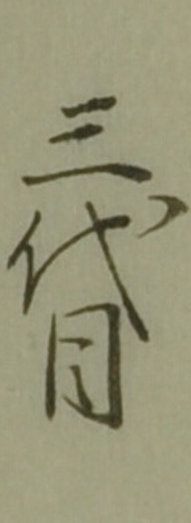三代目
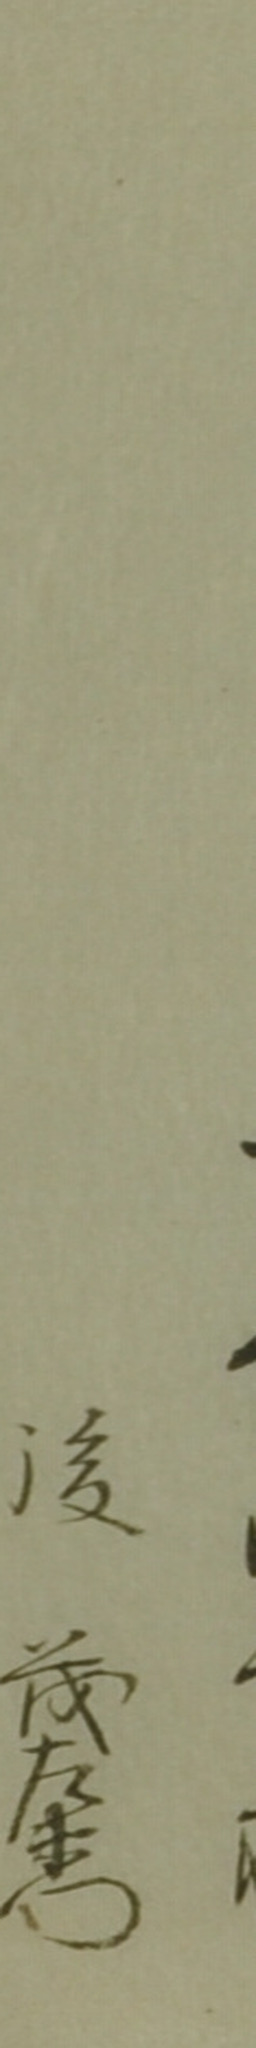後茂左衛門
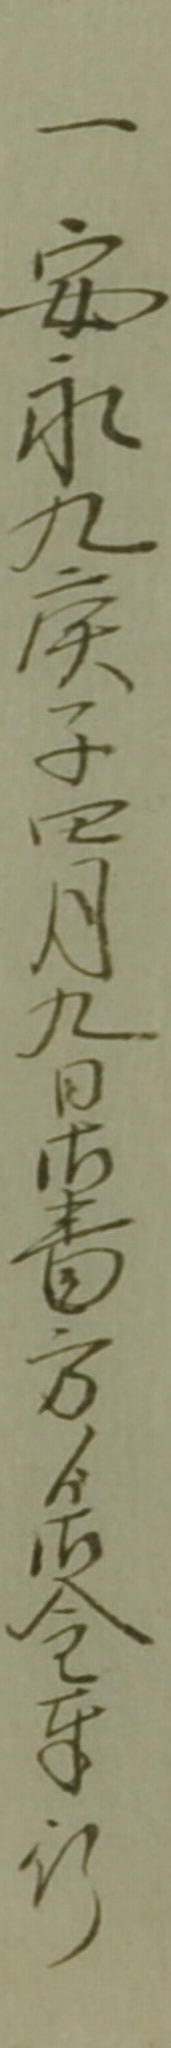一安永九庚子四月九日御番方ゟ御金奉行
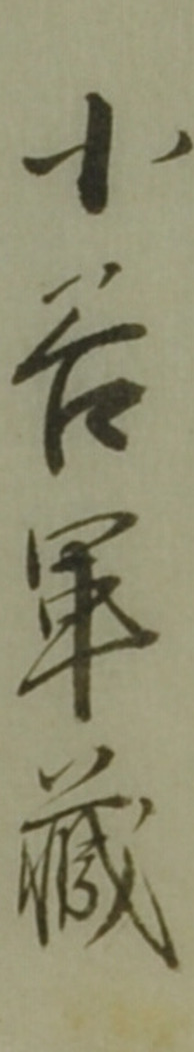小谷軍蔵
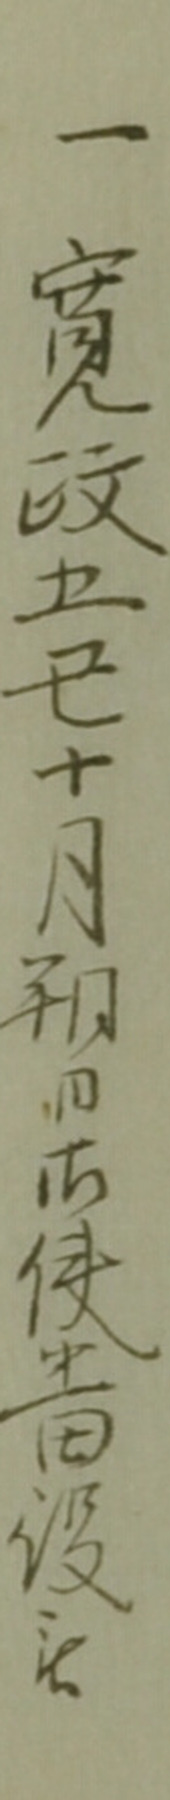一寛政五巳十月朔日御使番役被
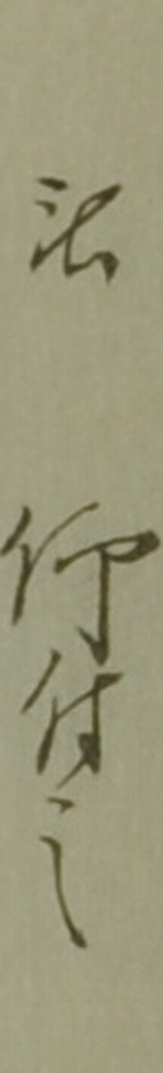被仰付之
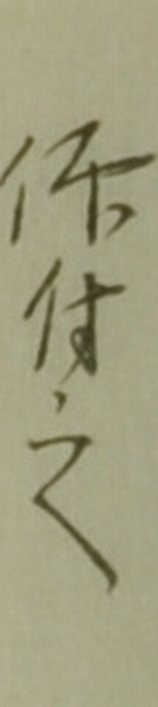仰付之

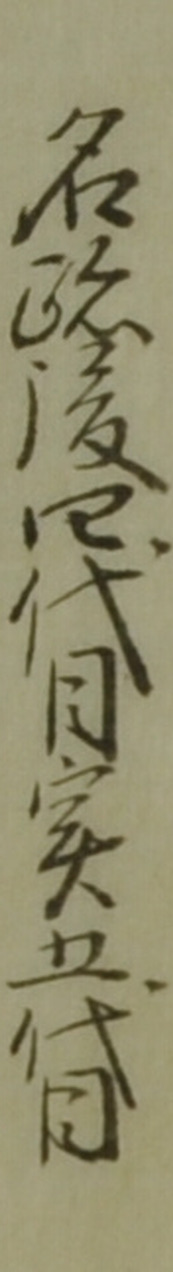名跡後四代目実五代目
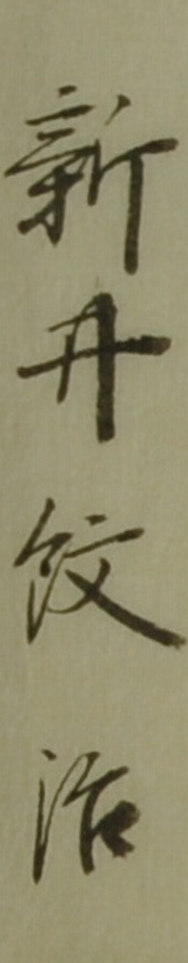新井紋治
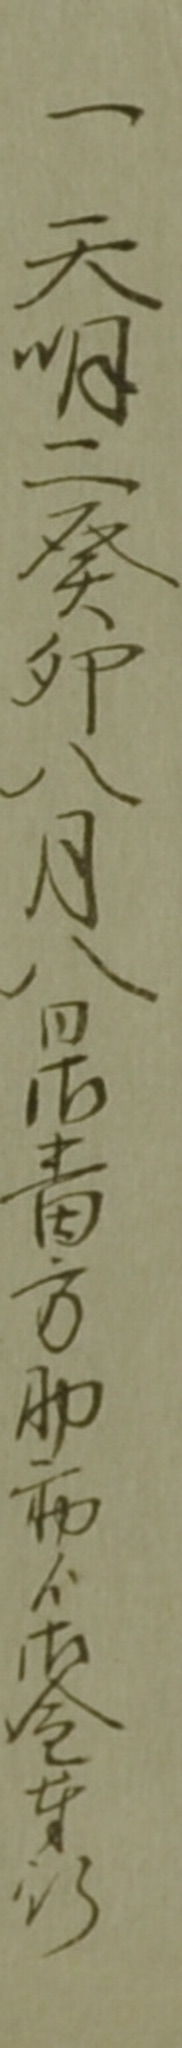一天明二癸卯八月八日御番方助勤ゟ御金奉行
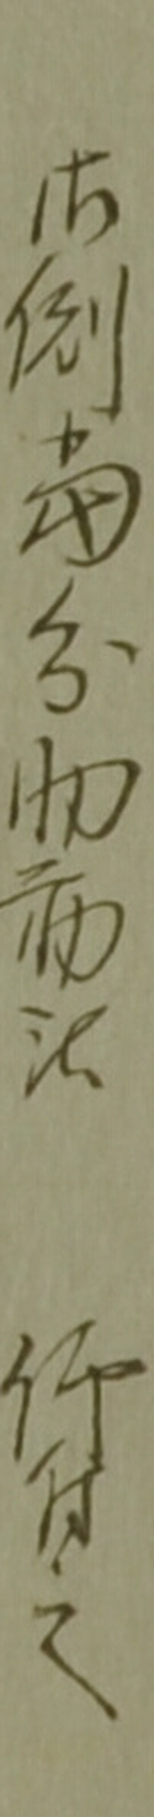御側当分助勤被仰付之
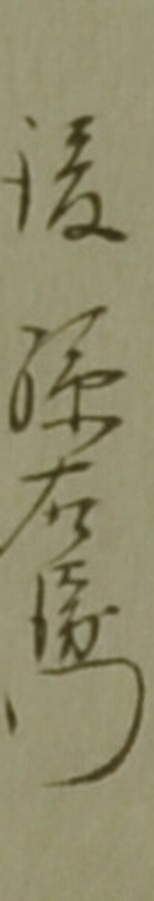後孫右衛門
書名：諸御役代々録（七）
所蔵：伊那市立高遠町図書館・合同会社AMANE
